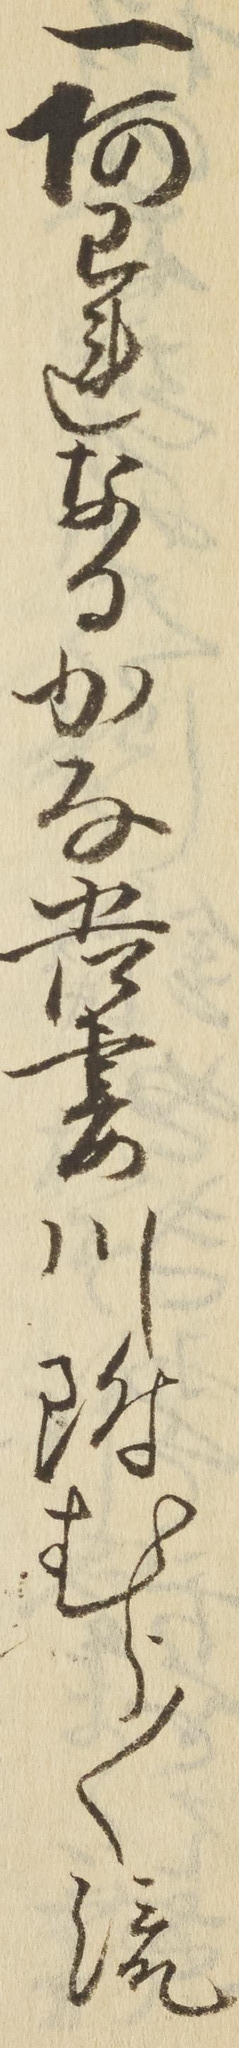一あわれなるかな吾妻川附むら〳〵流
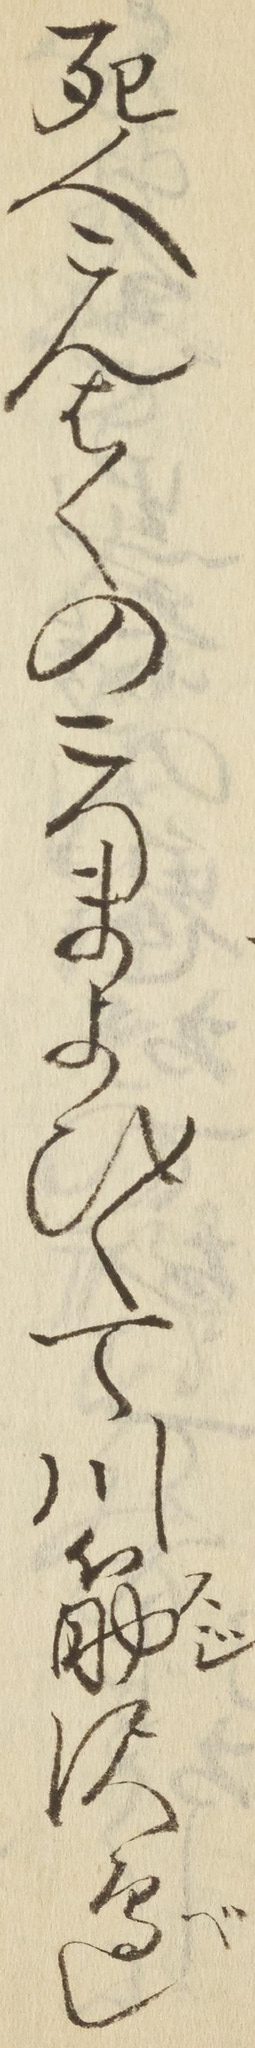死人こんはくのこりまよひて川筋沢辺
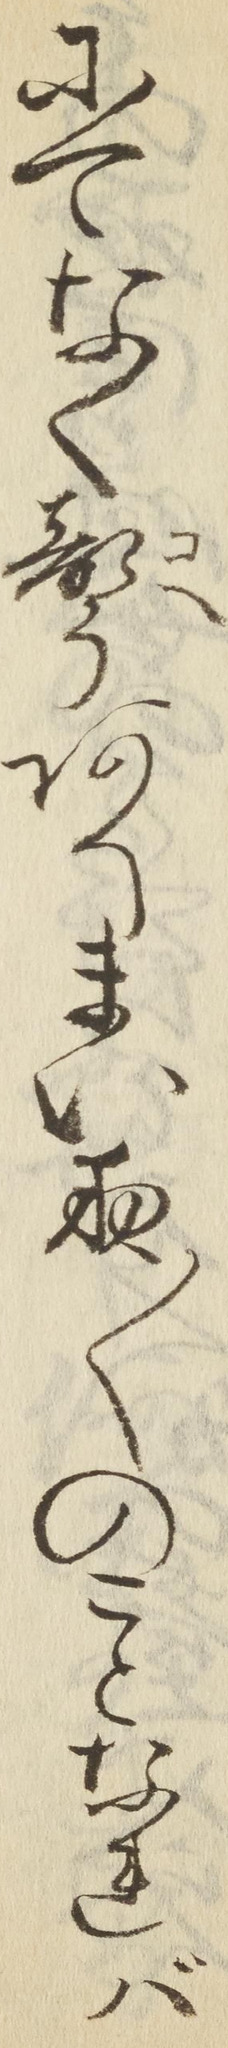にてなく声ありまい夜〳〵のことなれば
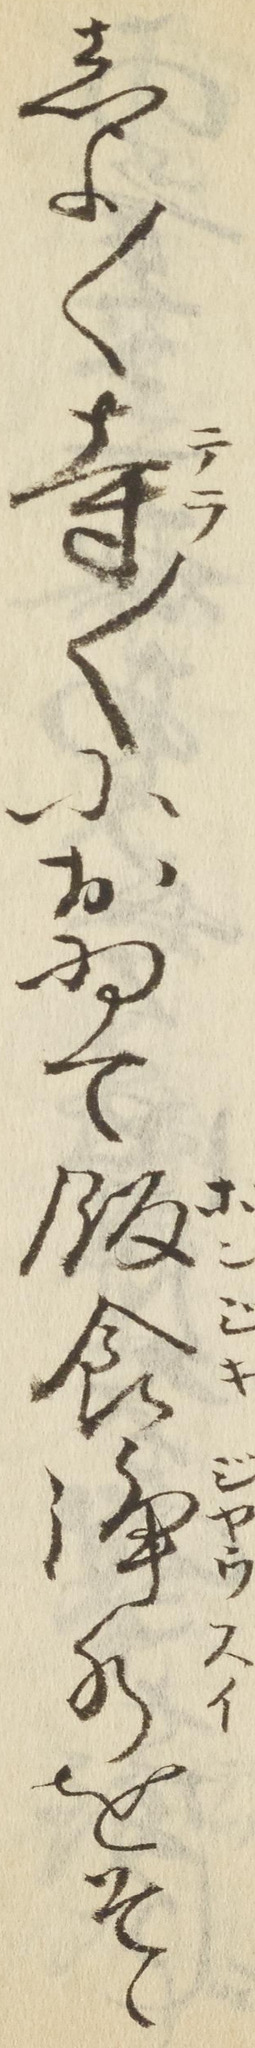しょ〳〵寺〳〵におゐて飯食浄水をそゝ
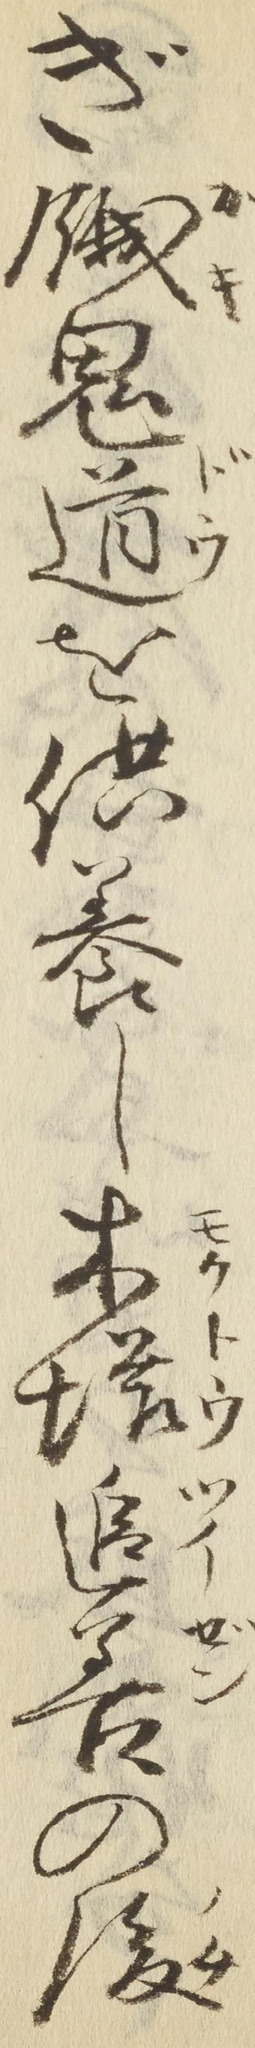ぎ餓鬼道を供養し木塔追善の後
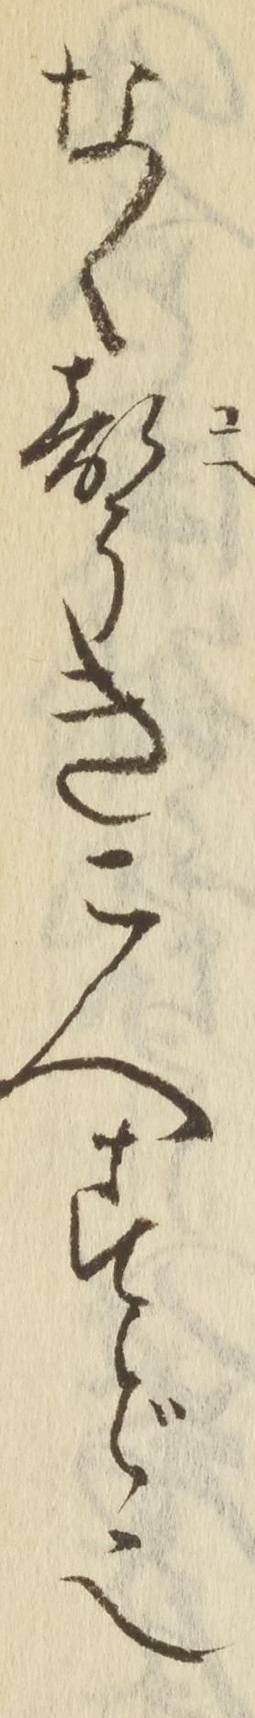なく声きこへすど也
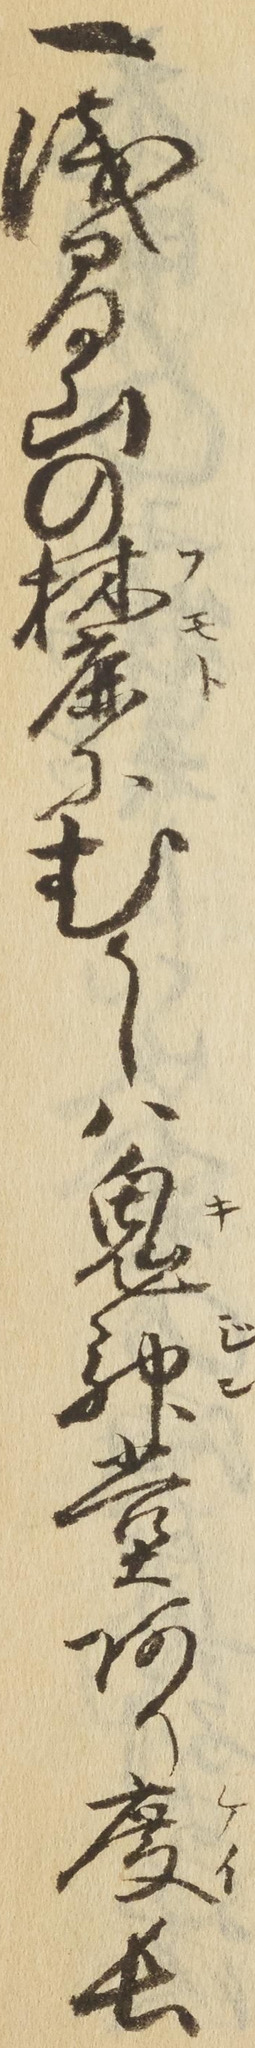一浅間山の麓にむかしは鬼神堂あり慶長

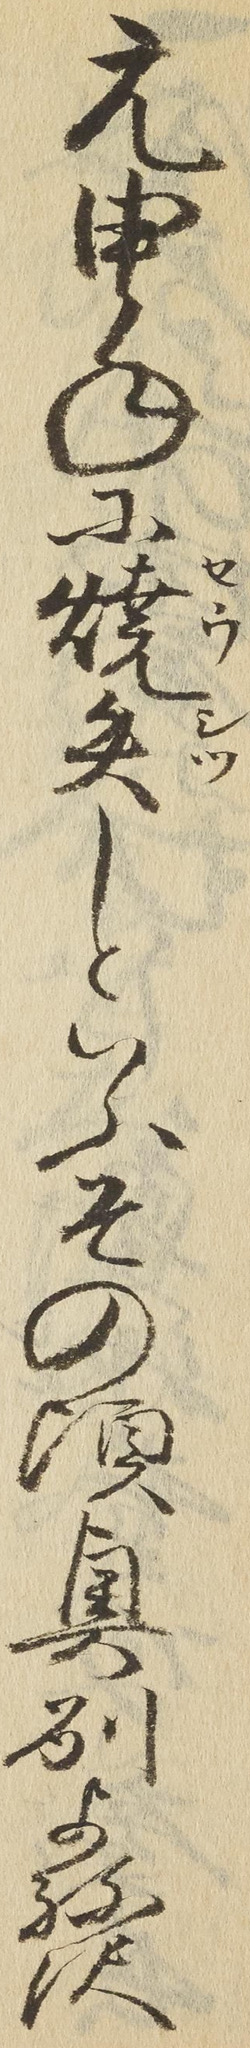元申年に焼失しといふその頃奥州よね沢
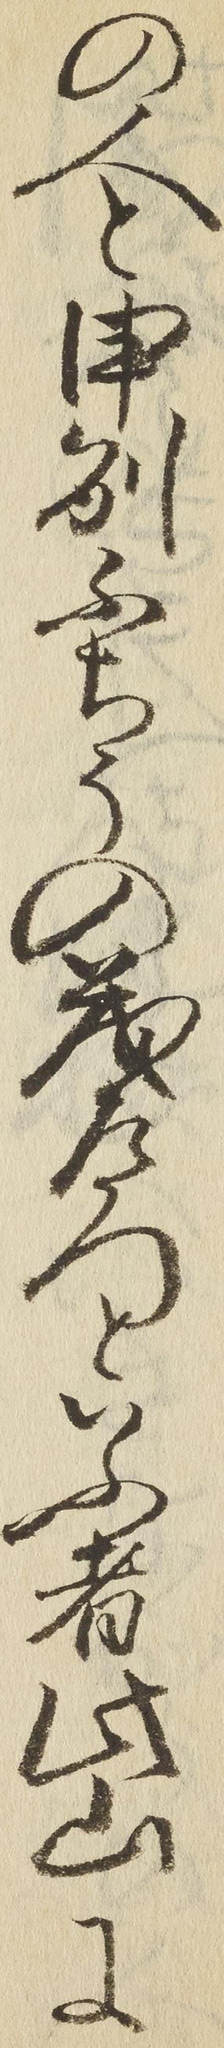の人と甲州ふちうの茂左衛門といふ者此山に
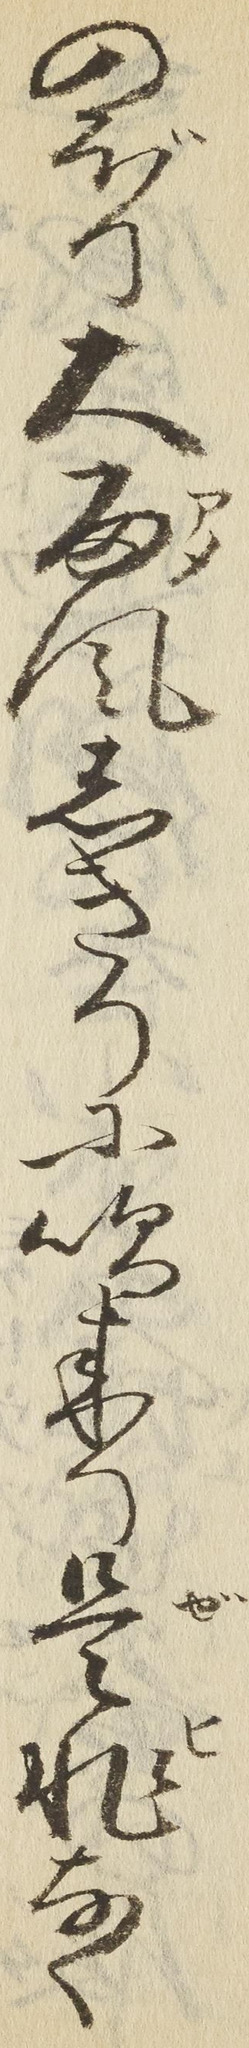のごり大風雨しきりに吹来り是非なく
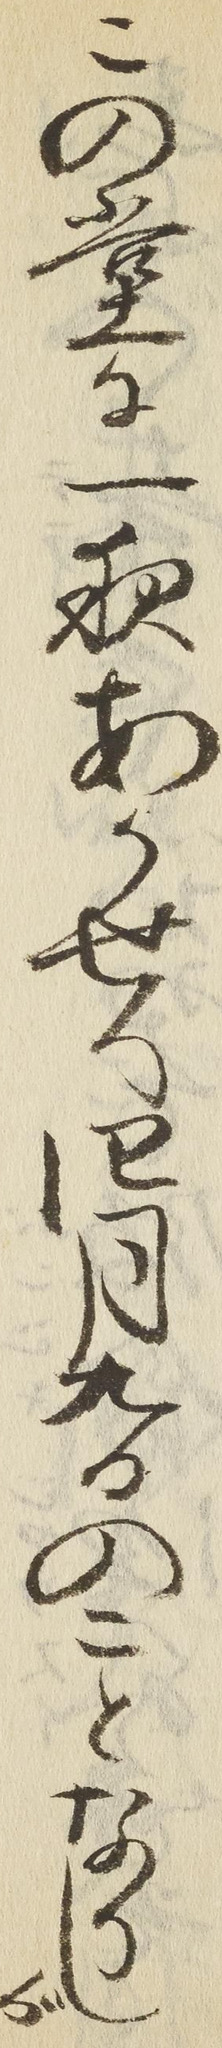この堂に一夜あかせり四月九日のことなりしか
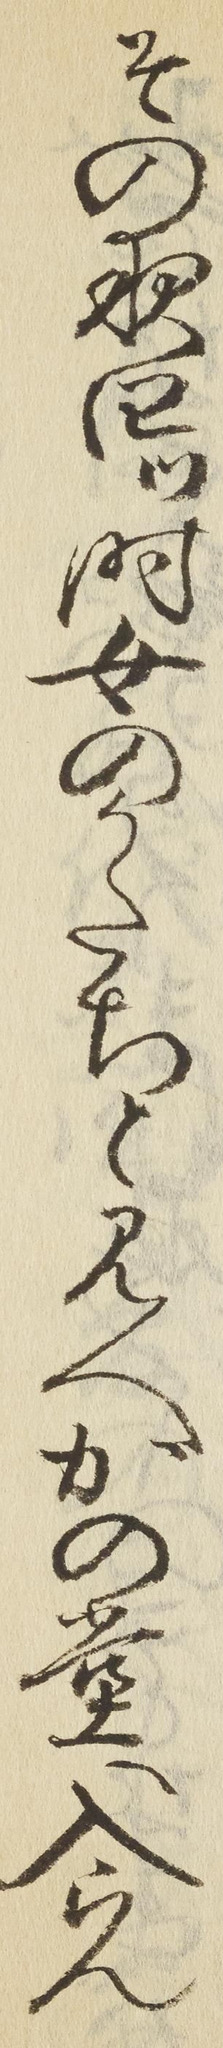その夜四ッ時女のかたち見へかの堂へ入らん
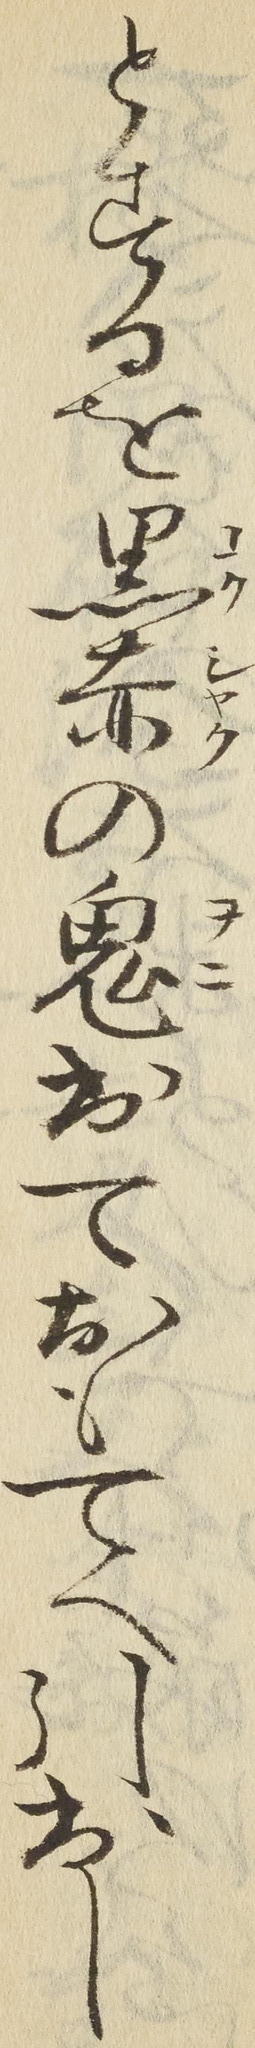とするを黒赤の鬼おておもてへ引出し
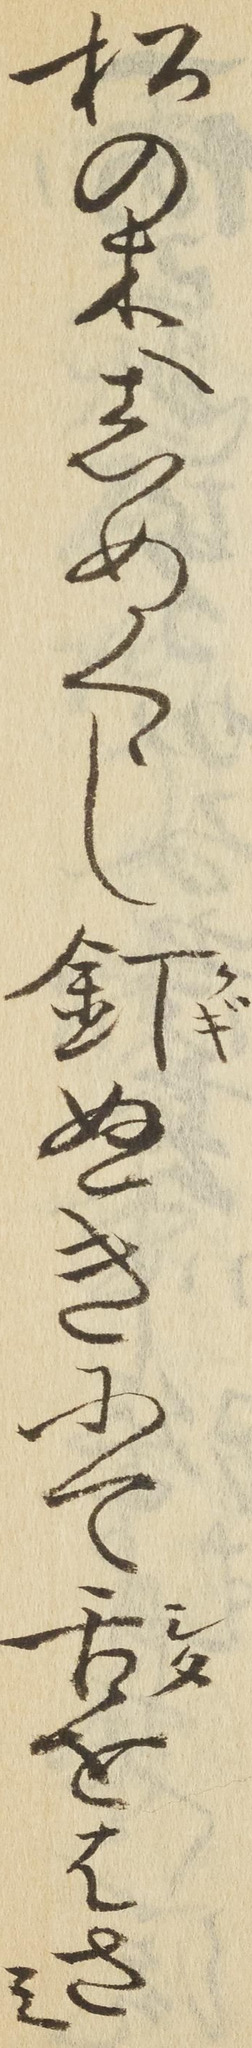松の木へしめくゝし釘ぬきにて舌をはさみ
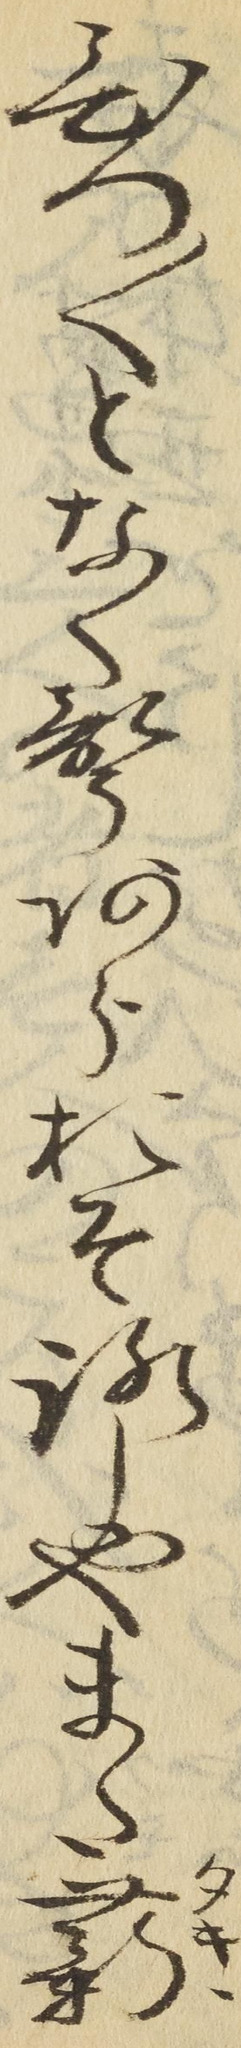ひつ〳〵となく声あらおそろしやまた薪
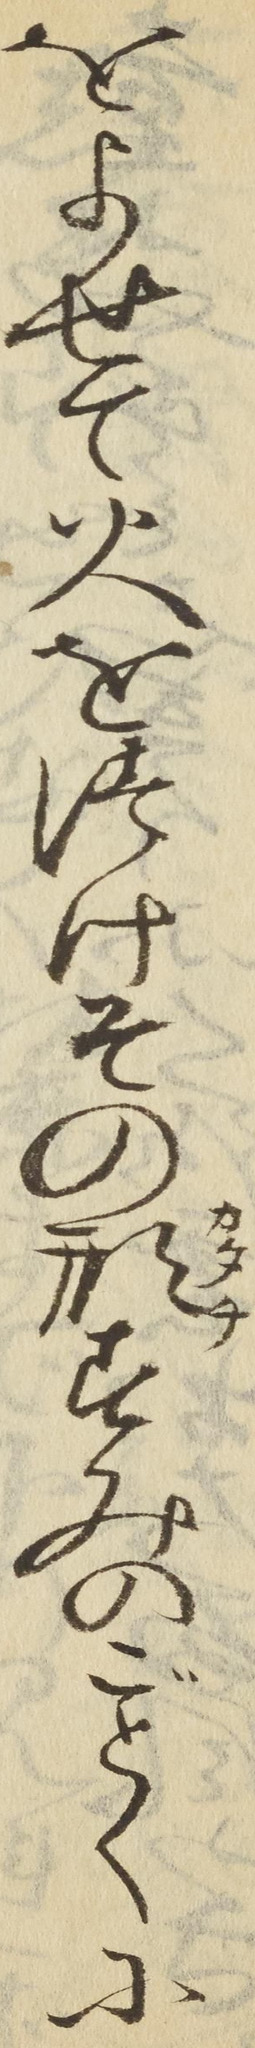をよせて火をつけその形すみのことくに
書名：浅間大變記
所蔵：東京大学地震研究所図書室 Earthquake Research Institute Library, The University of Tokyo, JAPAN
